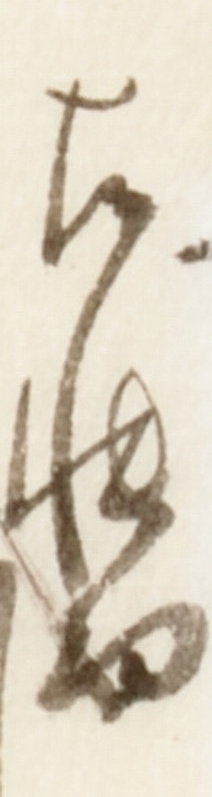右帳面
